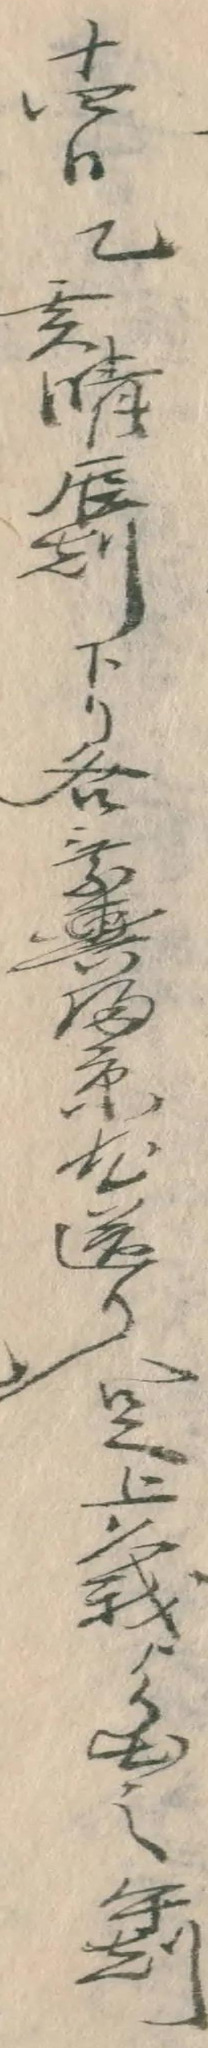十四日乙亥晴辰刻下り各方輿帰京尤送り人足上久我より出之午刻
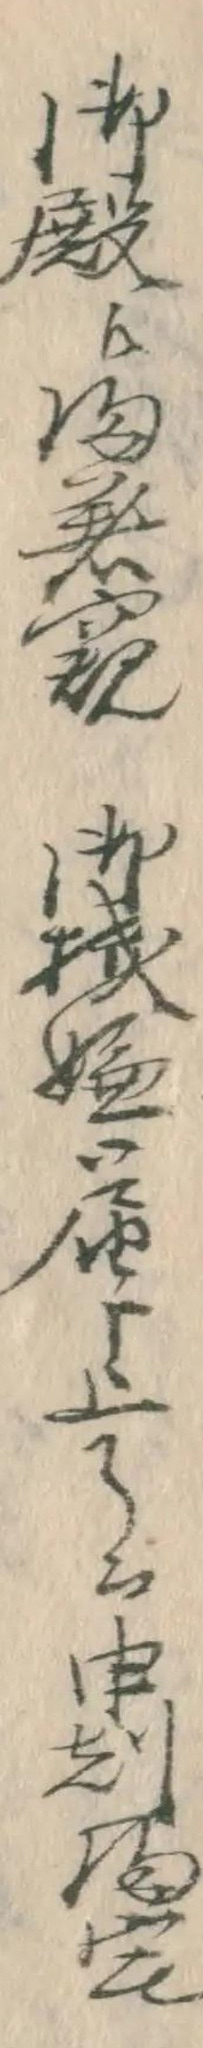御殿え帰着窺御機嫌御届申上了而申刻帰宅
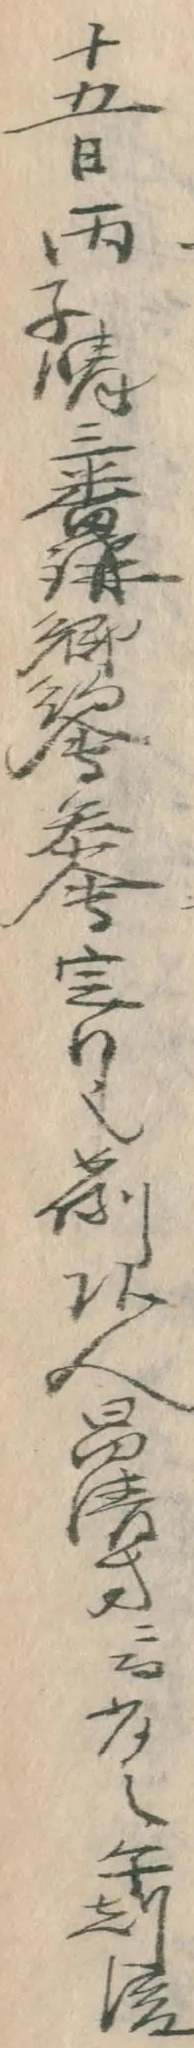十五日丙子晴三番講郷約會参會定日也如例頭人昌清方ニ而有之午刻後

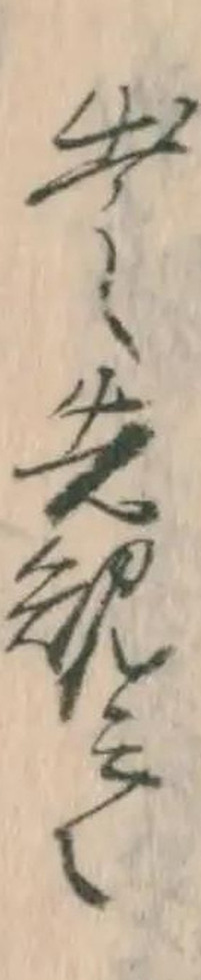出之先規云々
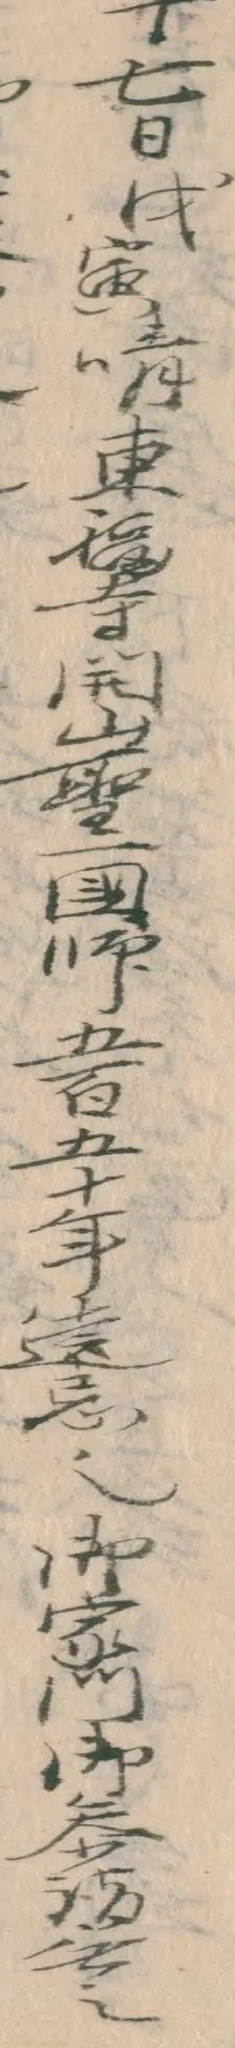十七日戊寅晴東福寺開山聖一國師五百五十年遠忌也御家門御参詣無之
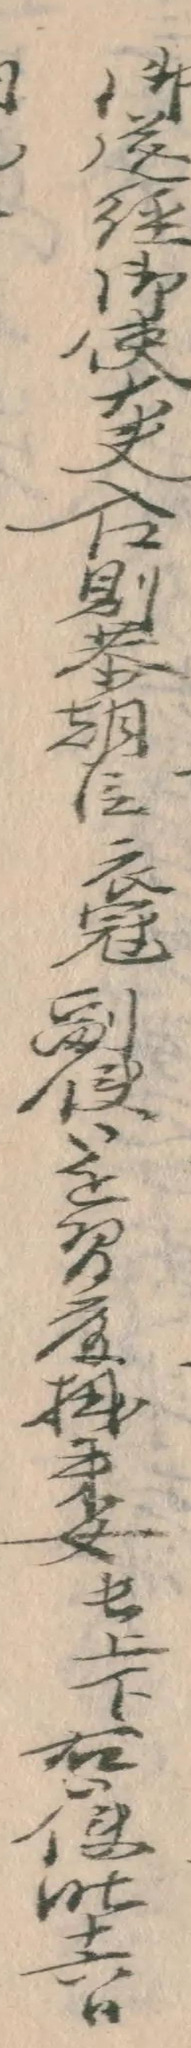御送経御使大夫入江則泰朝臣衣冠副使御遣習藤掛采女長上下右御使明十六日
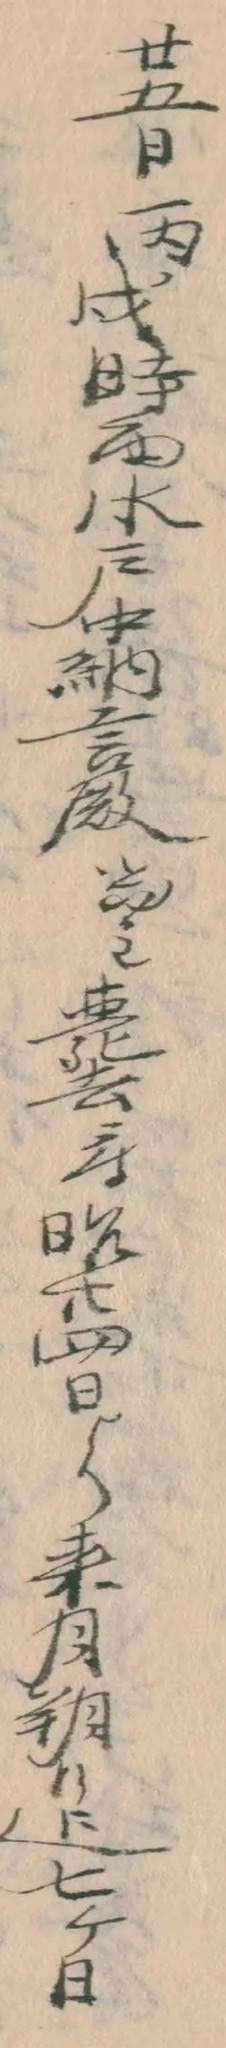廿五日丙戌時雨水戸中納言殿當主薨去ニ付昨廿四日より来月朔日迄七ケ日
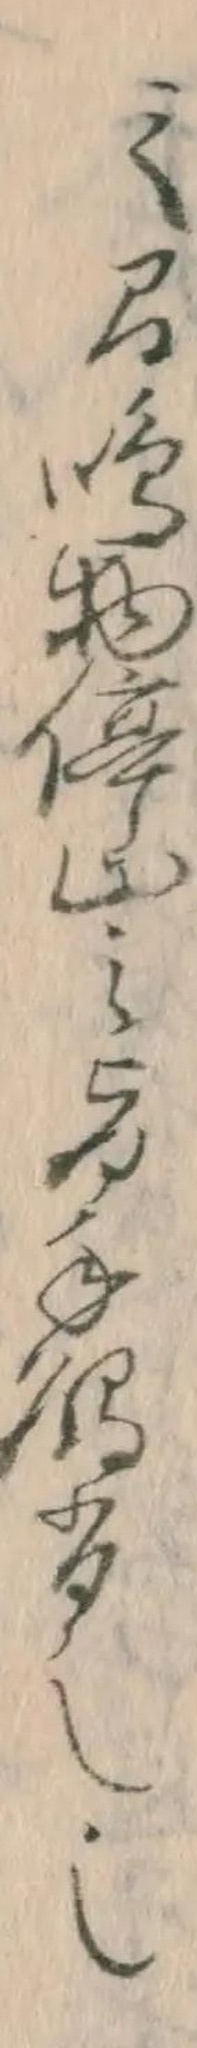之間鳴物停止之旨手触有之也
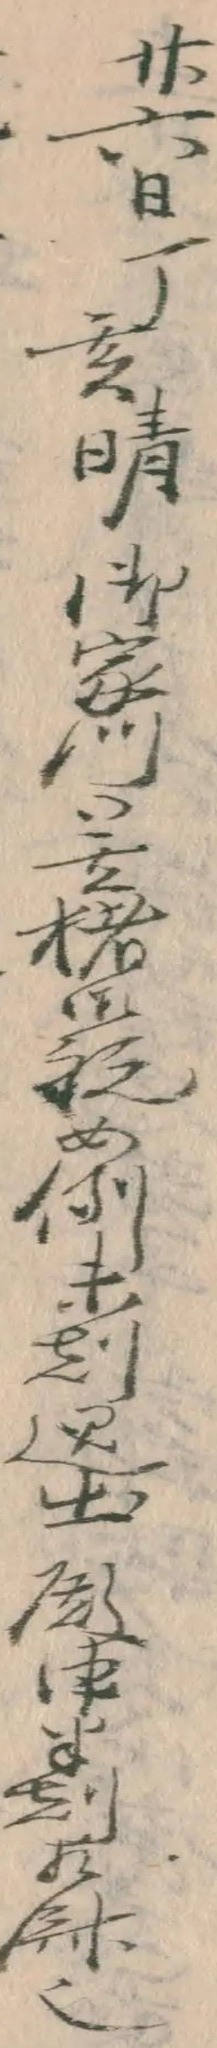廿六日丁亥晴御家門御玄猪御祝如例未刻過出殿申半刻相済也
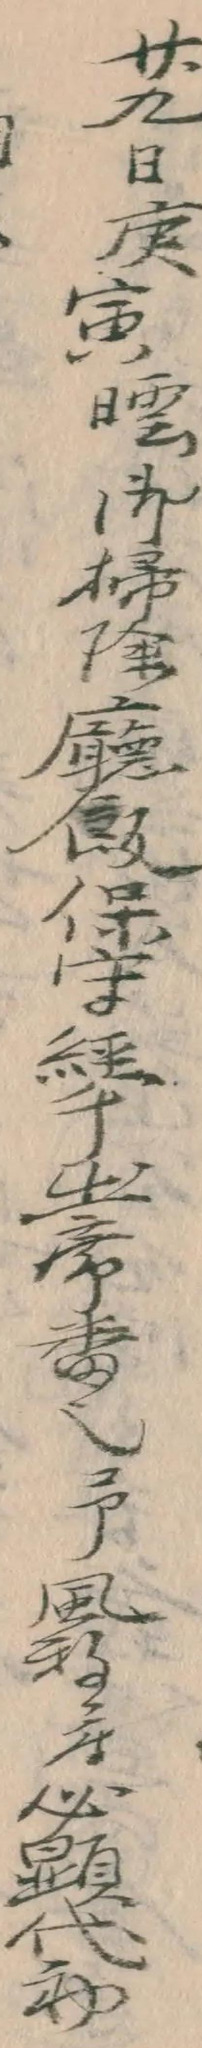廿九日庚寅晴御掃除廰飯保守経千出席番也予風邪ニ付必顕代勤
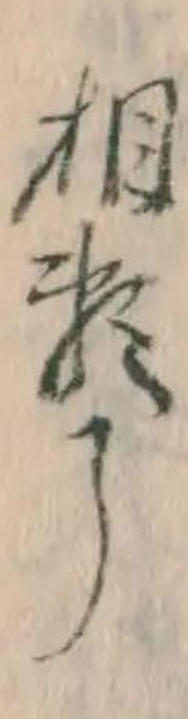相頼了
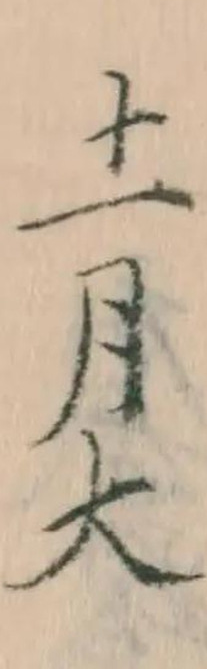十一月大
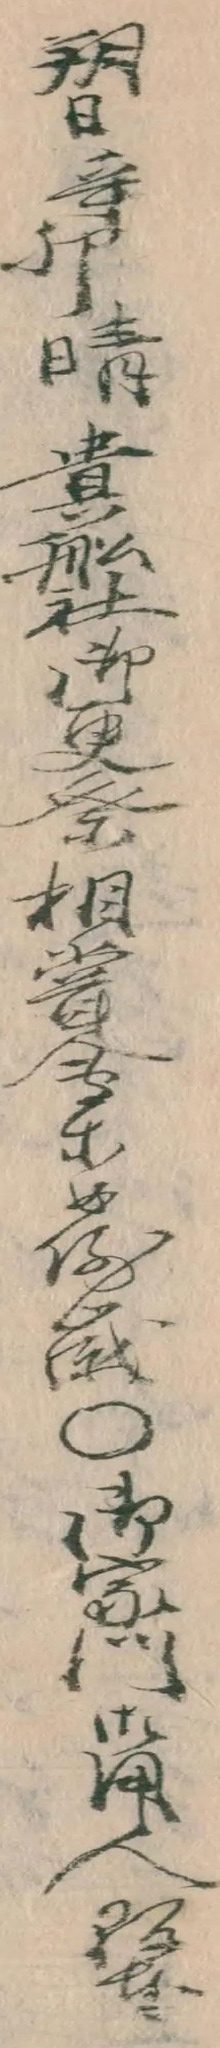朔日辛卯晴貴舩社御更祭相嘗會等如例歳○御家門御用人飯野
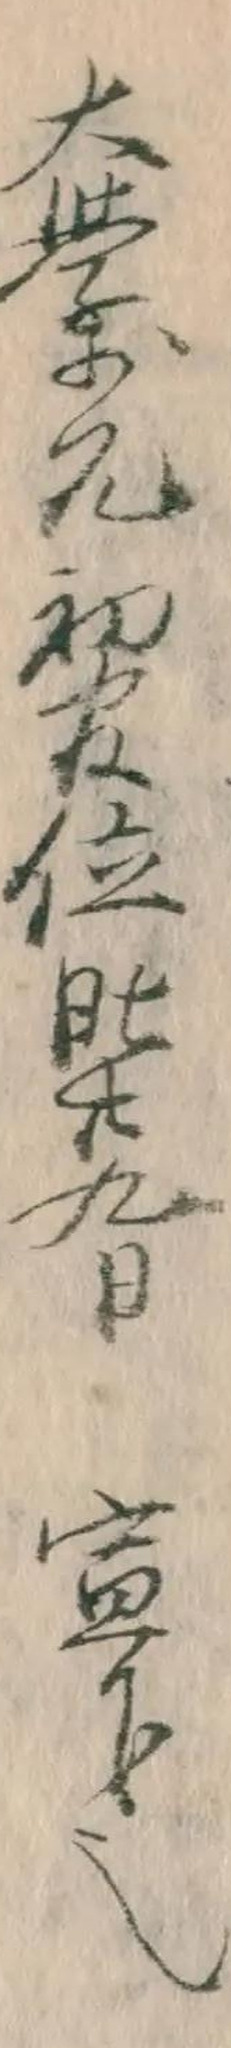大學允初官位昨廿九日宣下也
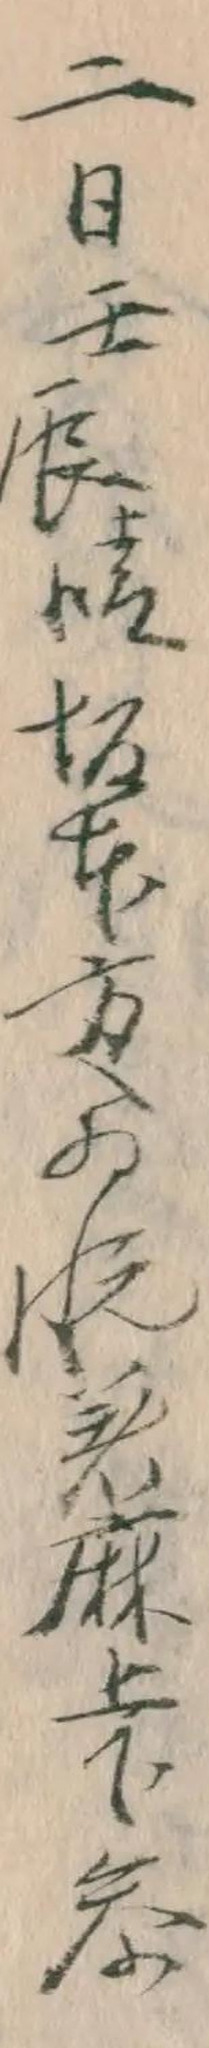二日壬辰晴坂本方へ為祝着麻上下参
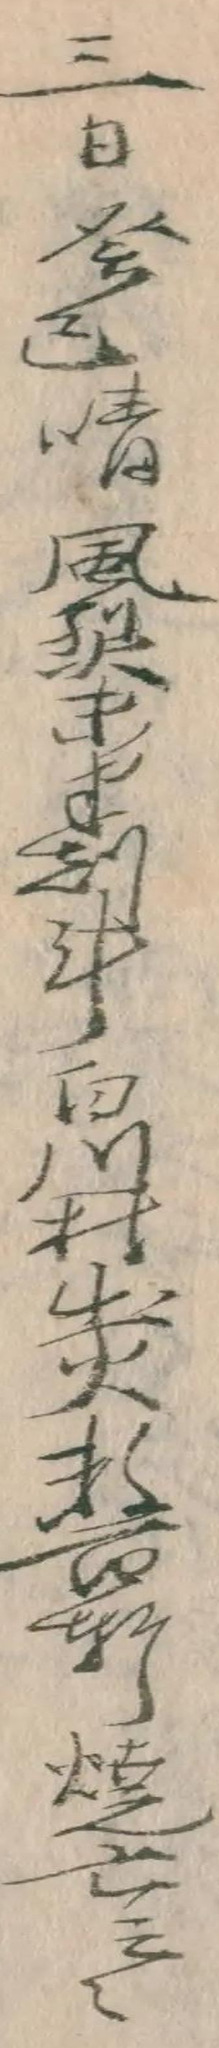三日癸巳晴風烈未半刻斗白川村出火数百軒焼亡云〻
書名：賀茂社記録. 第65冊
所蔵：国立国会図書館 National Diet Library, JAPAN
